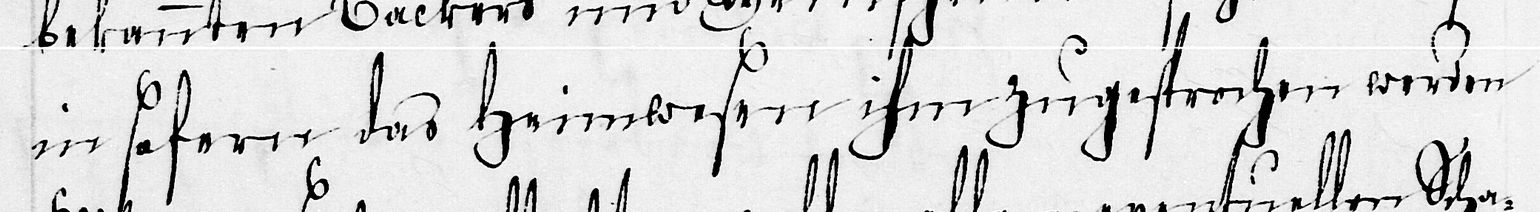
in sofern das Heimwesen ihm zugesprochen werden
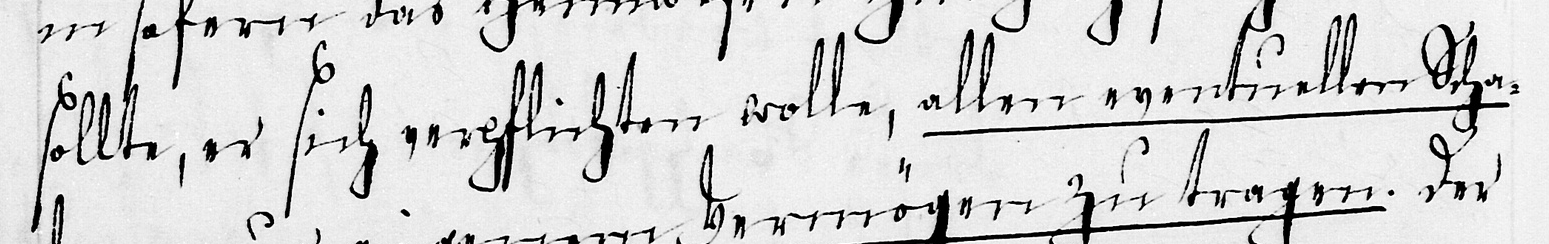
sollte, er sich verpflichten wolle, allen eventuellen Scha¬
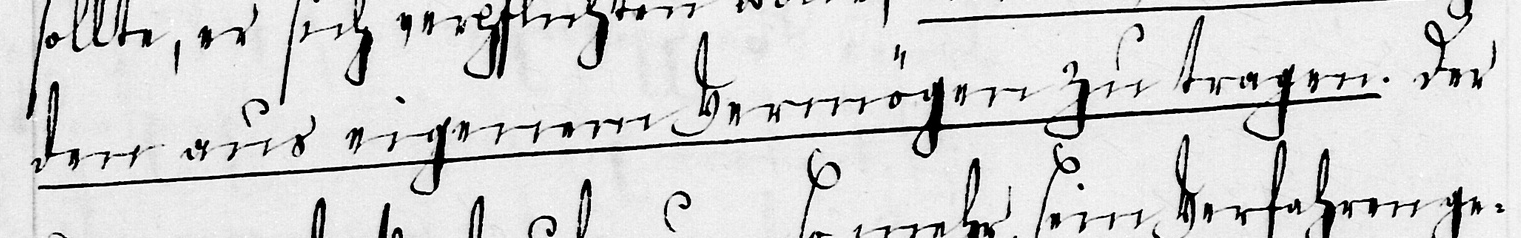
den aus eigenem Vermögen zu tragen. Der
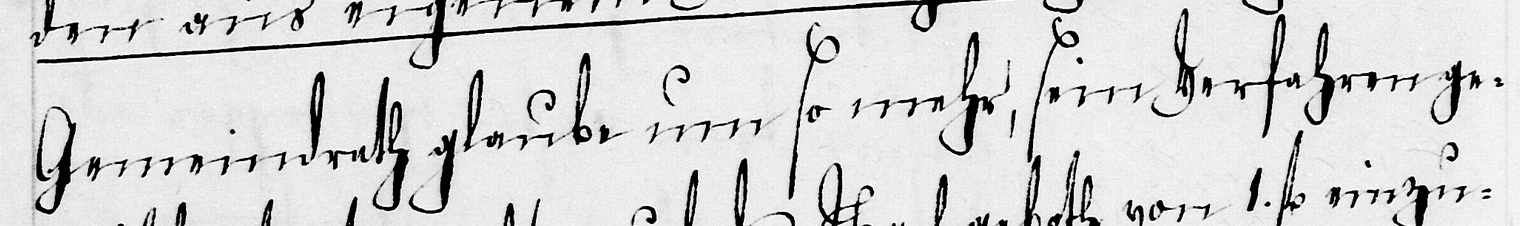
Gemeindrath glaube um so mehr, sein Verfahren ge¬
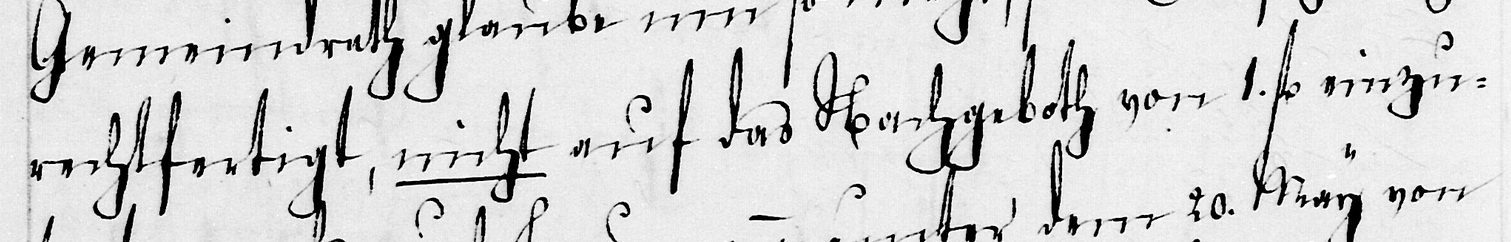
rechtfertigt, nicht auf das Nachgeboth von 1. fl. einzu¬
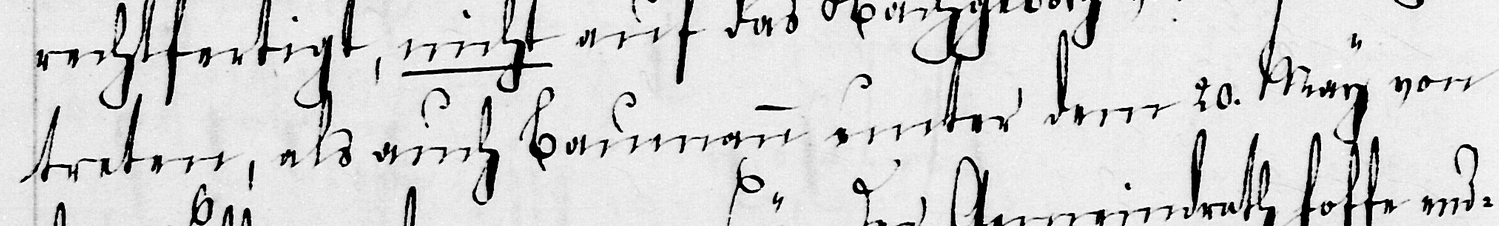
treten, als auch Baumann unter dem 20. May von
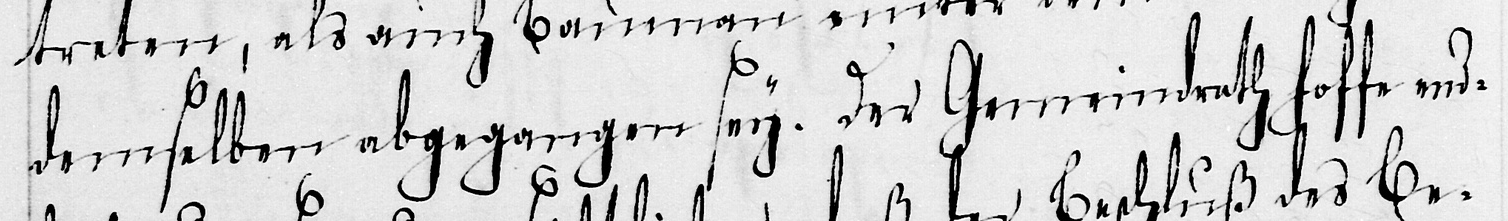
demselben abgegangen sey. Der Gemeindrath hoffe en¬
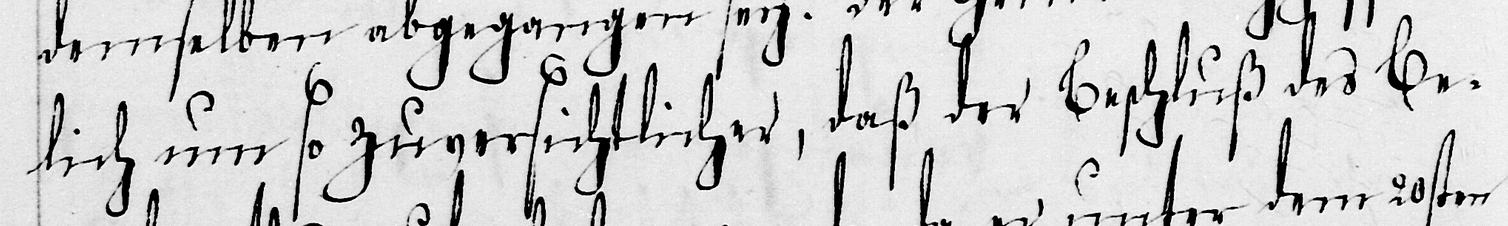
dlich um so zuversichtlicher, daß der Beschluß des Be¬
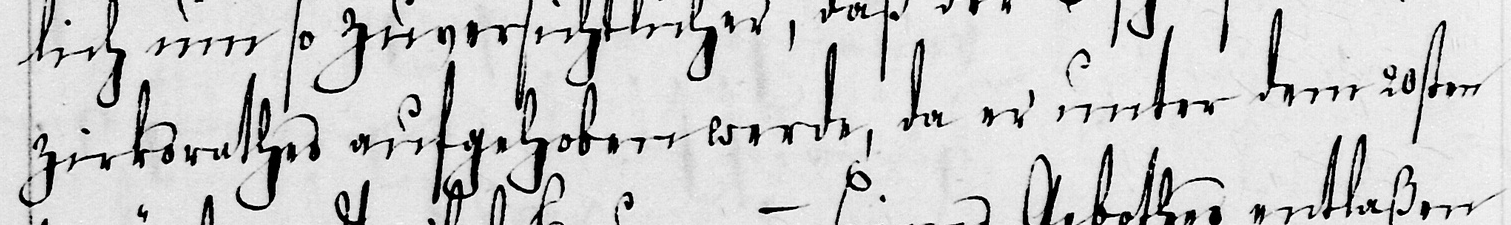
zirksrathes aufgehoben werde, da er unter dem 20sten
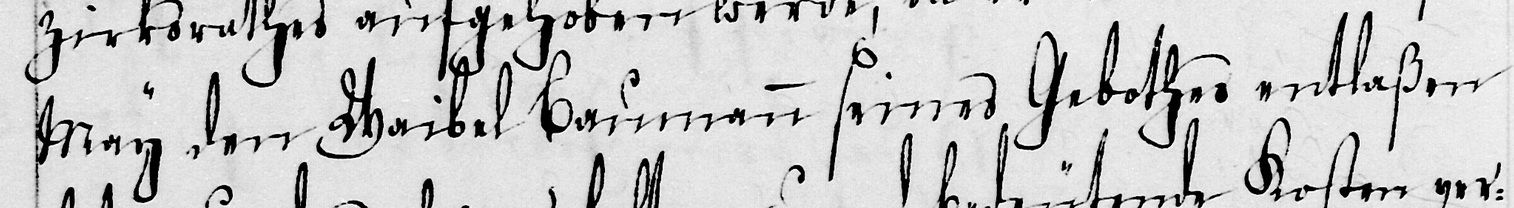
May den Waibel Baumann seines Gebothes entlaßen
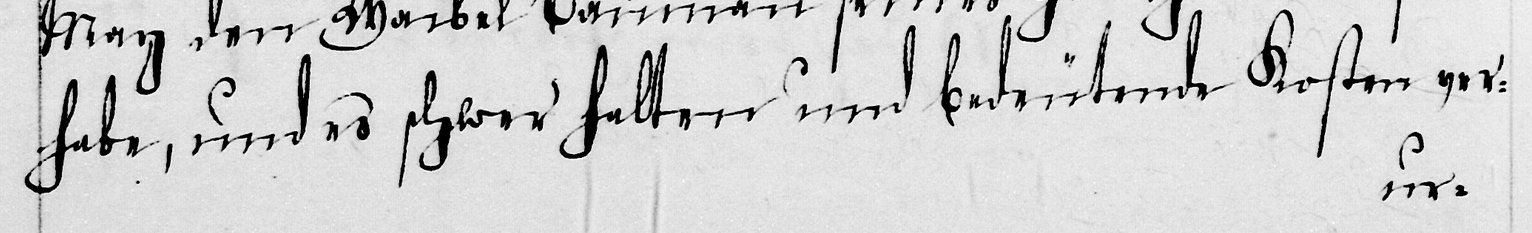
habe, und es schwer halten und bedeutende Kosten ver-
